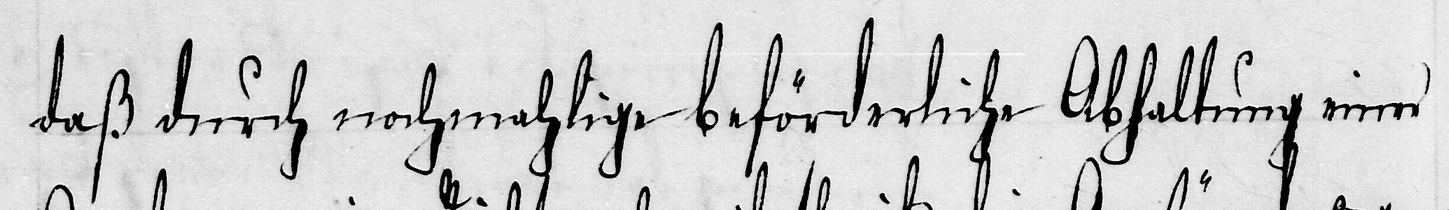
daß durch nochmahlige beförderliche Abhaltung einer
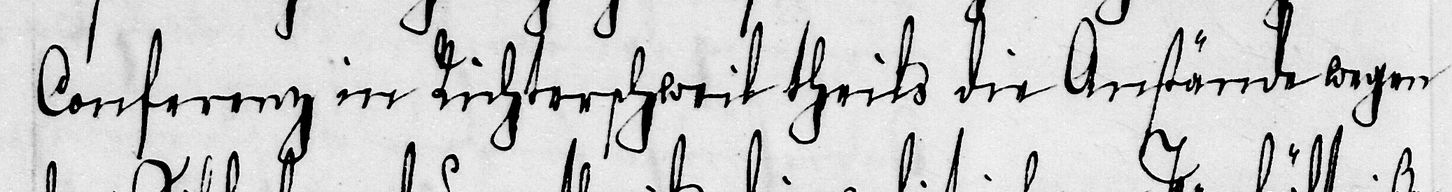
Conferenz in Richterschweil theils die Anstände wegen
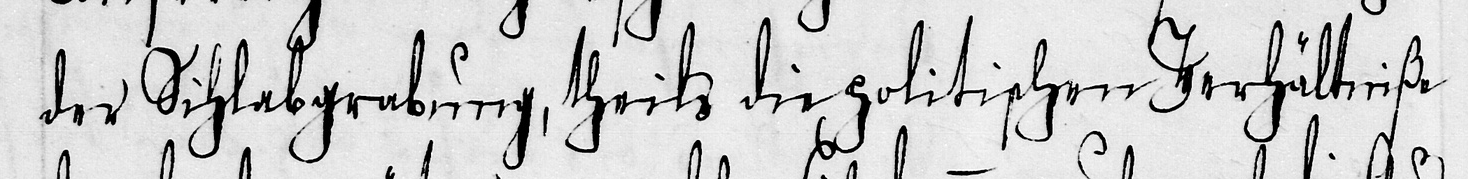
der Sihlabgrabung, theils die politischen Verhältniße
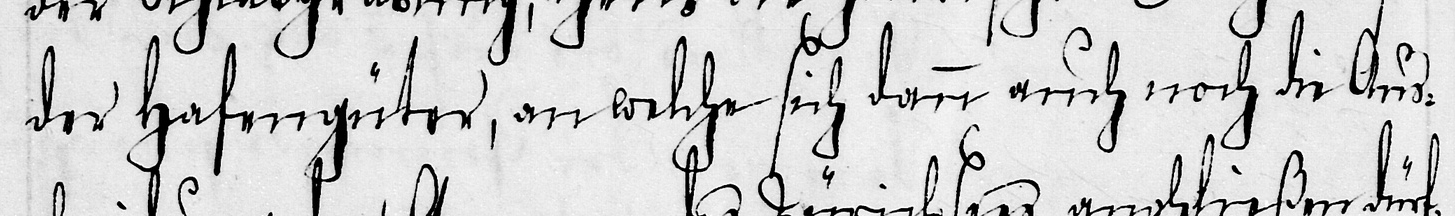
der Hafengüter, an welche sich dann auch noch die Aus¬
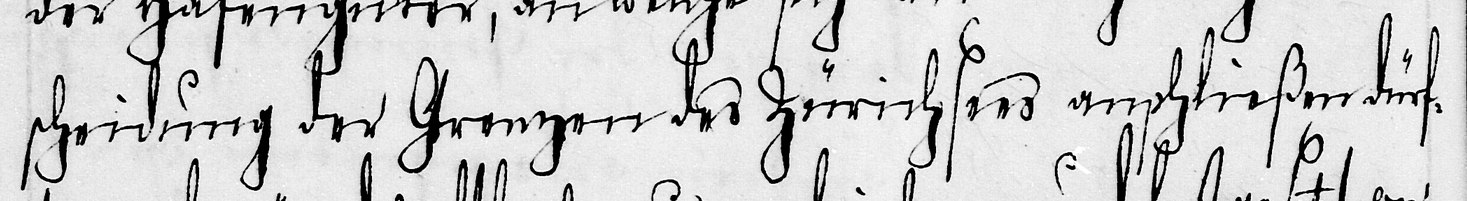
scheidung der Grenzen des Zürichsees anschließen dür¬
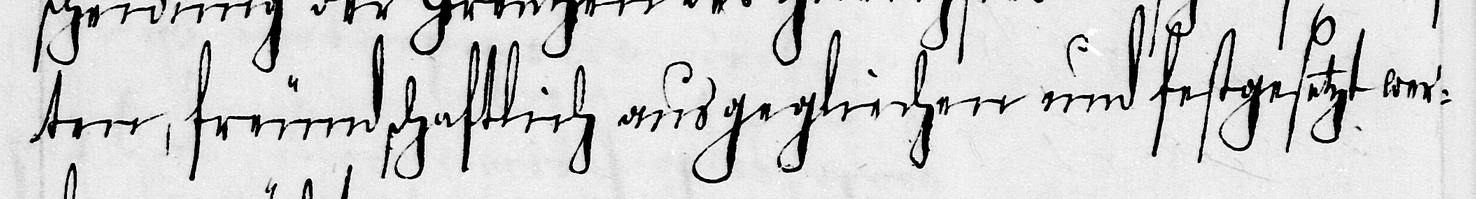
ften, freundschaftlich ausgeglichen und festgesetzt w¬
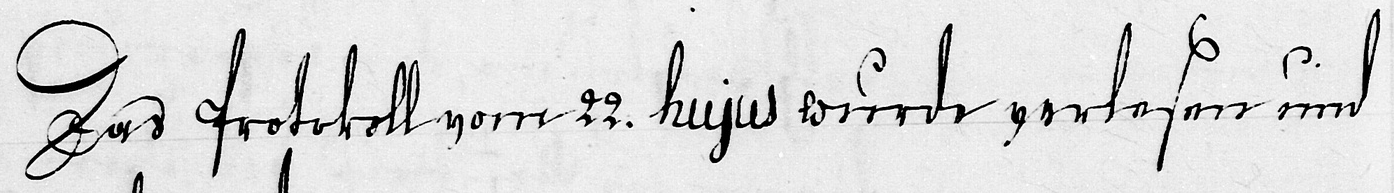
Das Protokoll vom 22. hujus wurde verlesen und
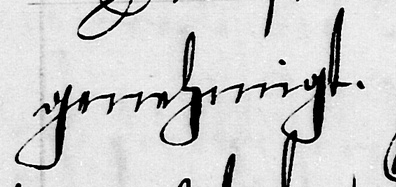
genehmigt.
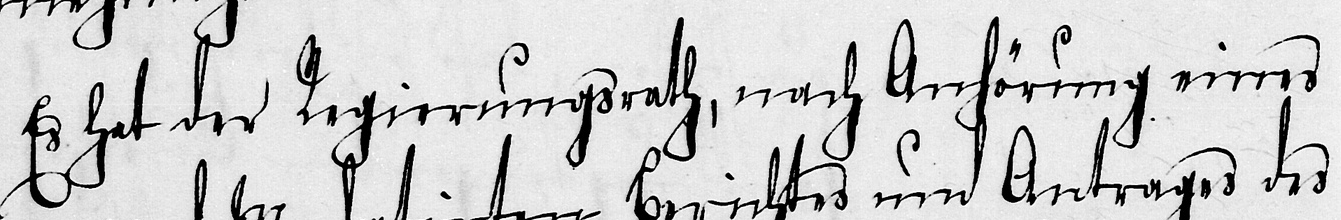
Es hat der Regierungsrath, nach Anhörung eines
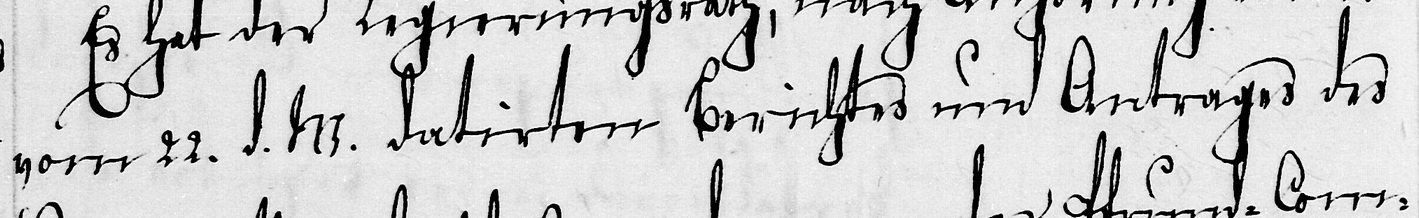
vom 22. d. M. datirten Berichtes und Antrages des
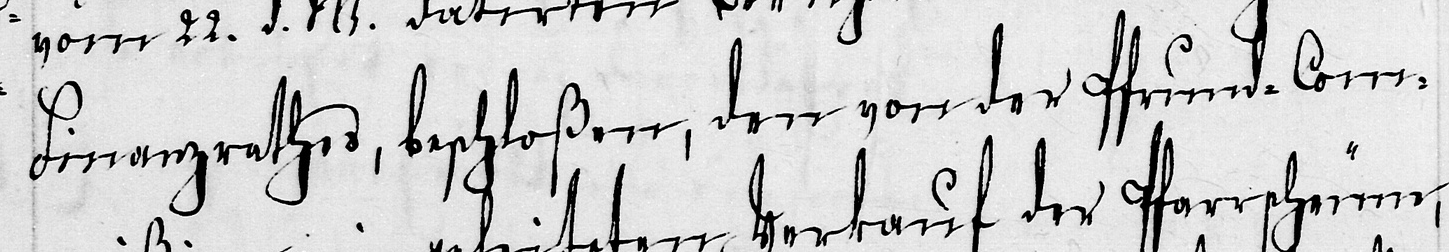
Finanzrathes, beschloßen, den von der Pfrund-Com¬
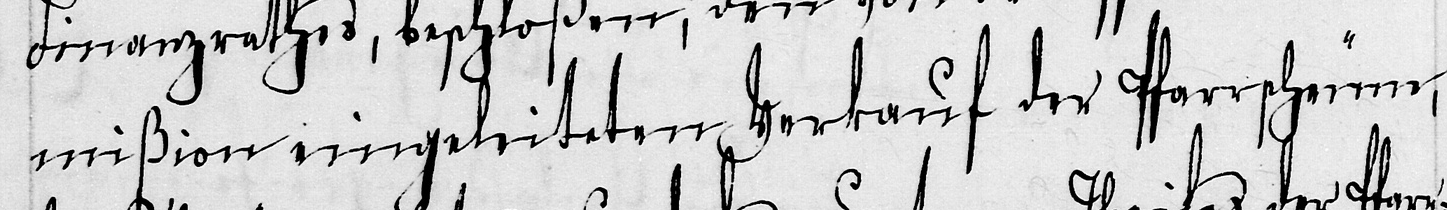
mißion eingeleiteten Verkauf der Pfarrscheune,
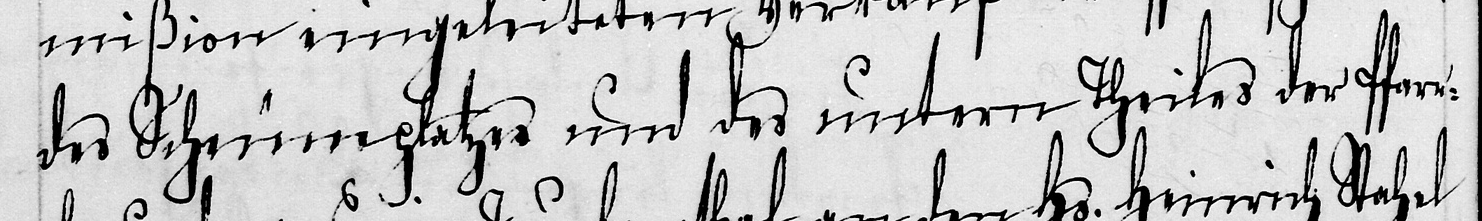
des Scheuneplatzes und des untern Theiles der Pfar¬
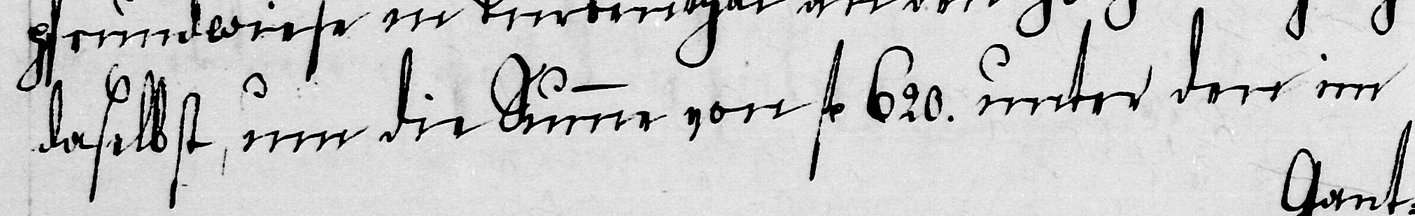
daselbst, um die Summe von fl. 620. unter den im
